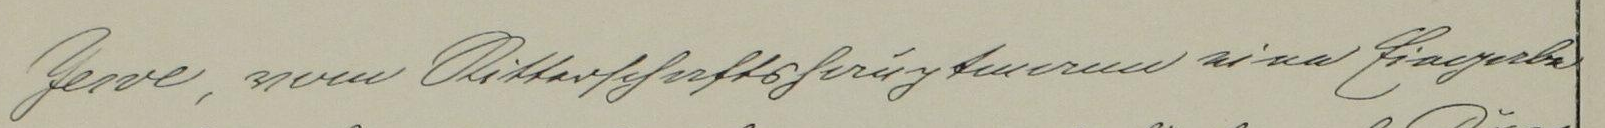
Jewe, vom Ritterschaftshauptmann eine Eingabe
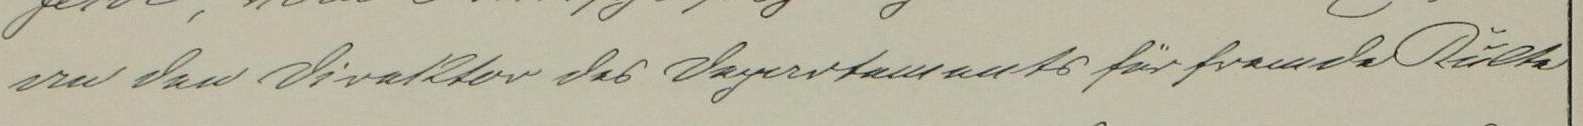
an den Direktor des Departements für fremde Kulte
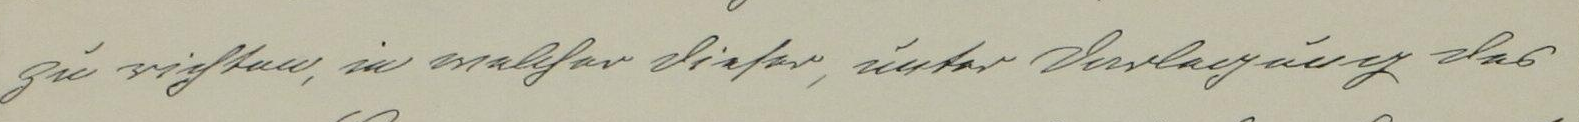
zu richten, in welcher dieser, unter Darlegung des
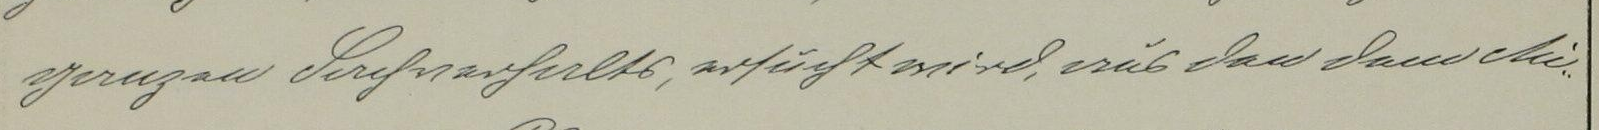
ganzen Sachverhalts, ersucht wird, aus den dem Mi-
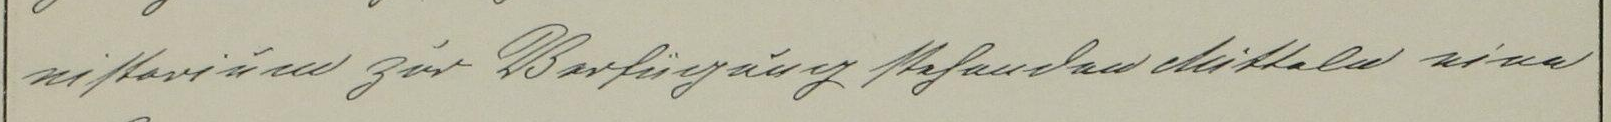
nisterium zur Verfügung stehenden Mitteln eine
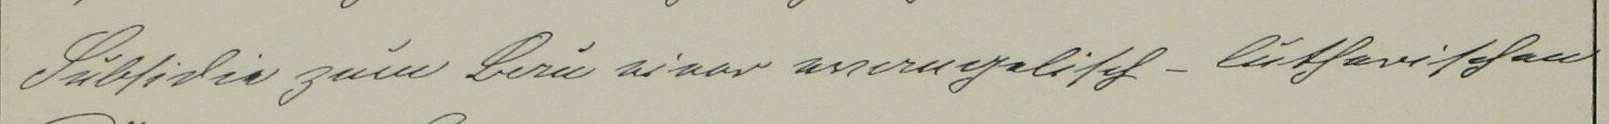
Subsidie zum Bau einer evangelisch-lutherischen
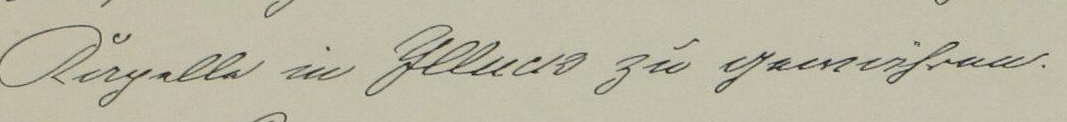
Kapelle in Illuck zu gewähren.
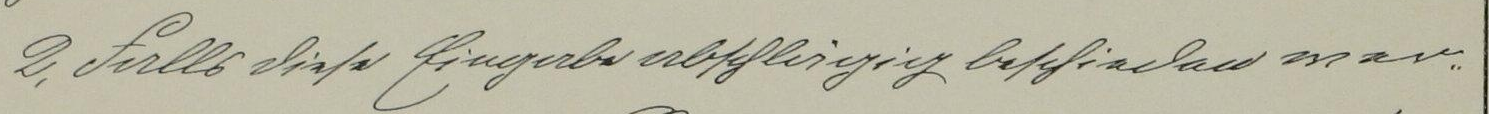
2. Falls diese Eingabe abschlägig beschieden wer-
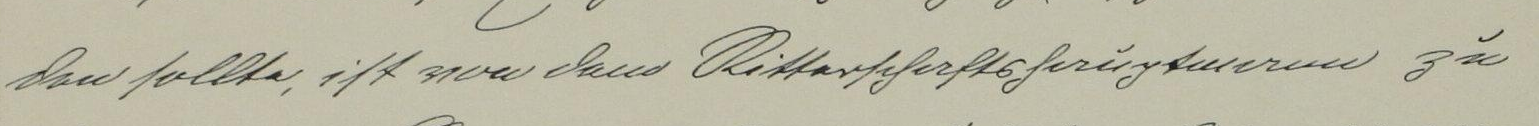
den sollte, ist von dem Ritterschaftshauptmann zu
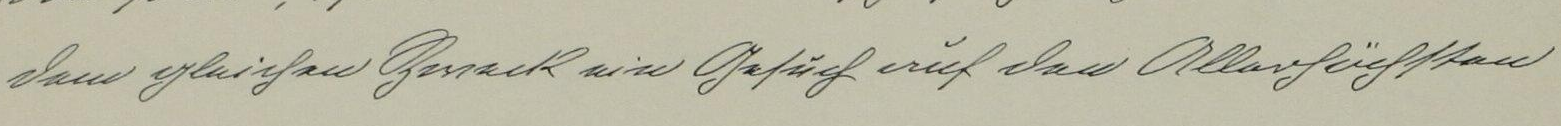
dem gleichen Zweck ein Gesuch auf den Allerhöchsten
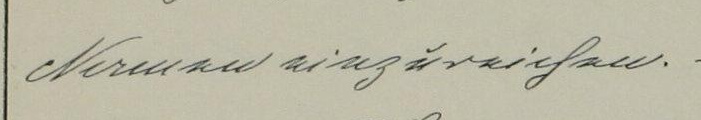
Namen einzureichen.
